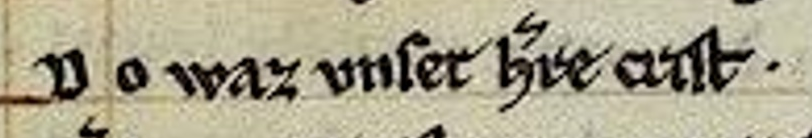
Do waz vnſer h(er)re criſt.
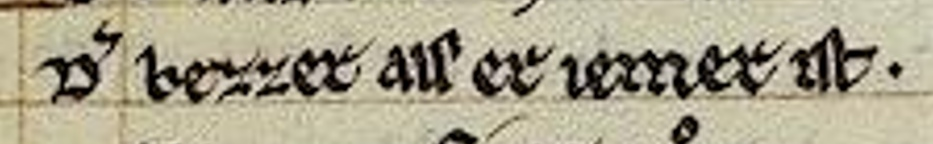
D(er) bezzer alſ er iemer iſt.
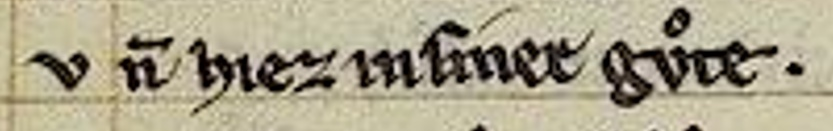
Vn(d) hiez in ſiner gv°ote.
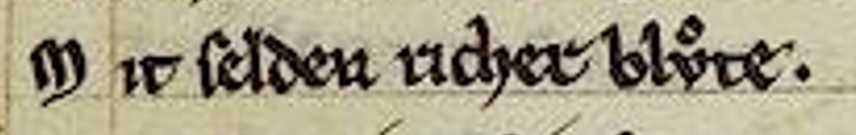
Mit ſelden richer blv°ote.
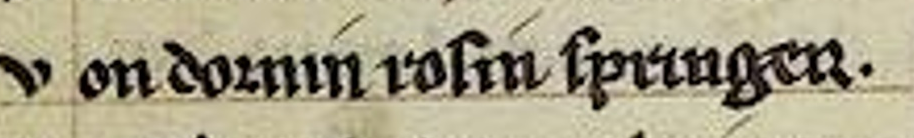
Von dornin roſin ſpringen.
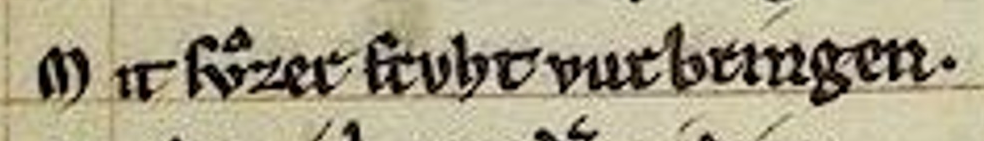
MIt ſv°ozer frvht vurbringen.
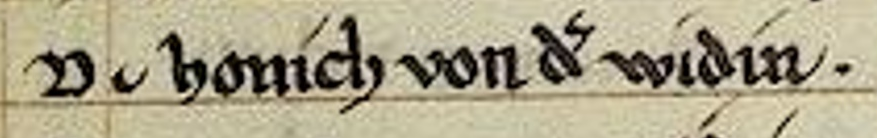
D(az) honich von d(er) widin.
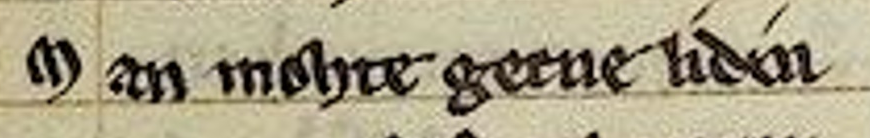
Man mohte gerne lidin.
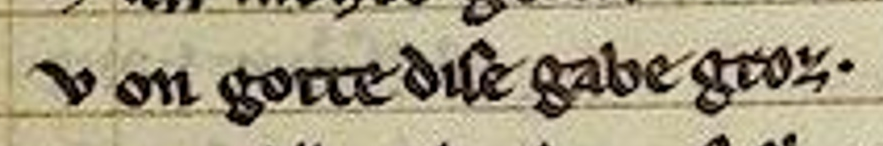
Von gotte diſe gabe groz.
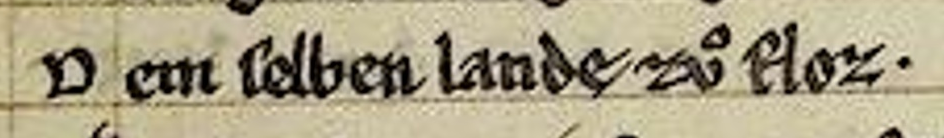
Dem ſelben lande zv°o floz.
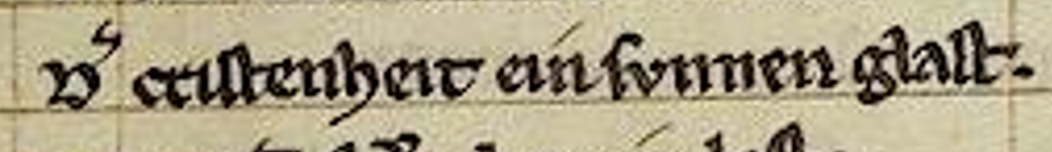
D(er) criſtenheit ein ſvnnen glaſt.
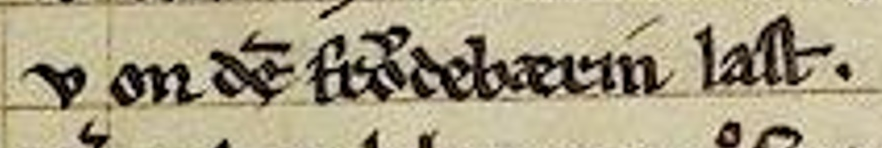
Von de(m) fro°vdeb[ae]rin laſt.
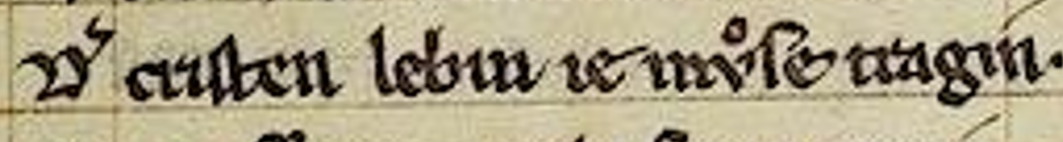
D(er) criſten lebin ie mv°oſe tragin.
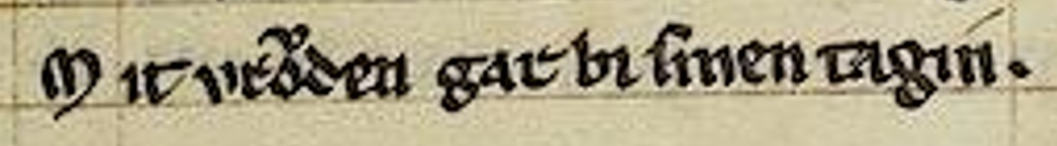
Mit vro°vden gar bi ſinen tagin.
